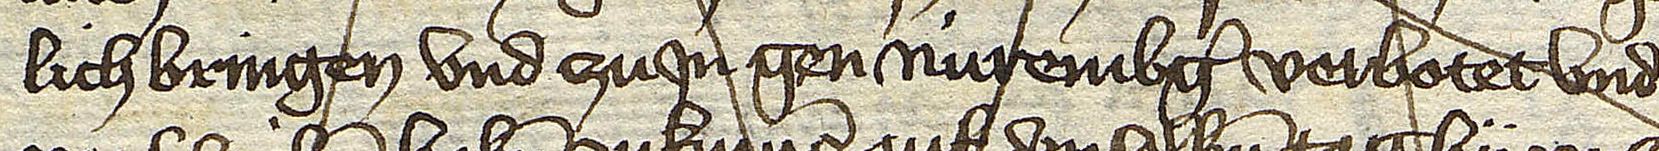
lich bringen vnd cʒu In gen Nüremb*g verbotet vnd
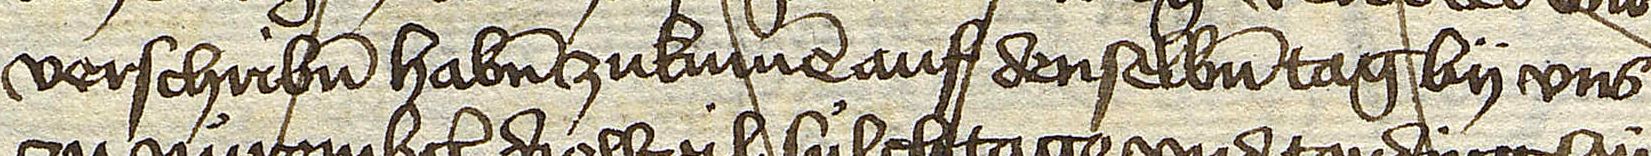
verſchrib*n hab*n cʒukume* auf denſelb*n tag by vns
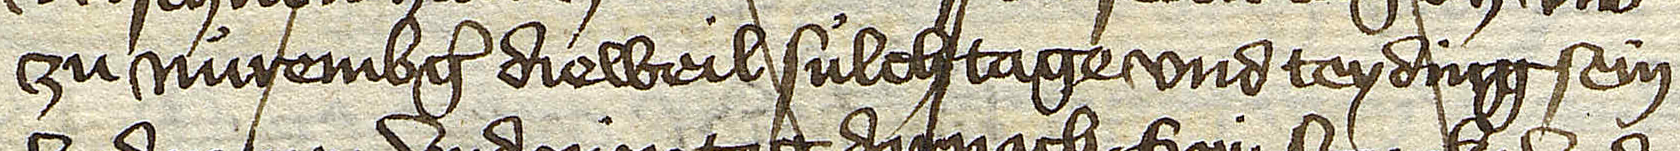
cʒu Nüremb*g dieweil ſülch tage vnd teyding ſein
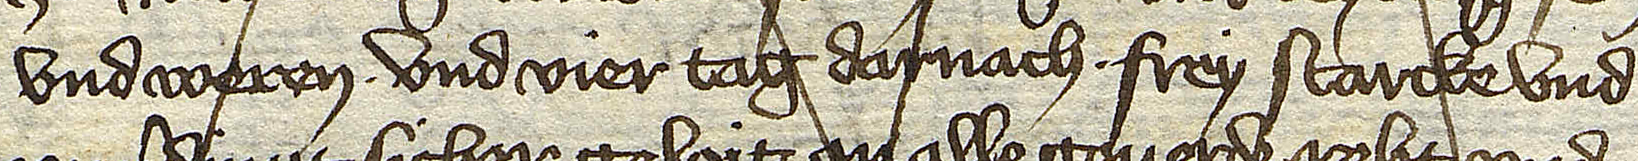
vnd weren . vnd vier tag darnach . frey ſtarcke vnd
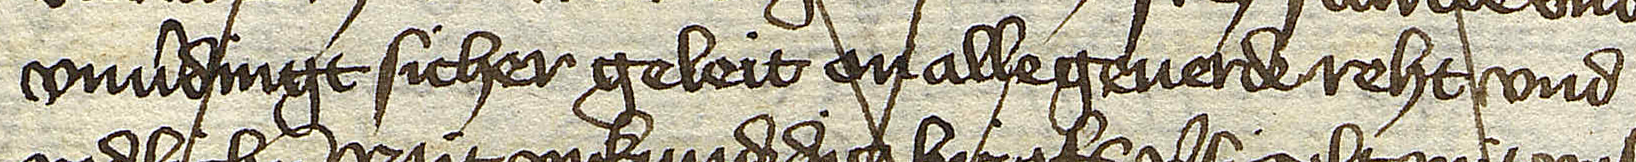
vnu*dingt ſicher geleit on alle geuerde reht vnd
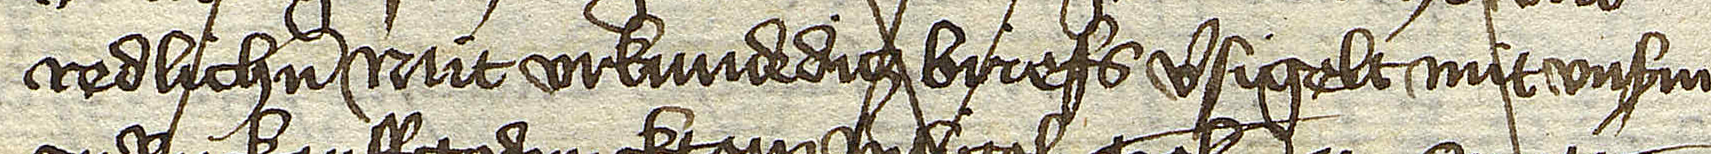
redlich*n Mit vrkunde dicʒ briefs v*ſigelt mit vnſ*m
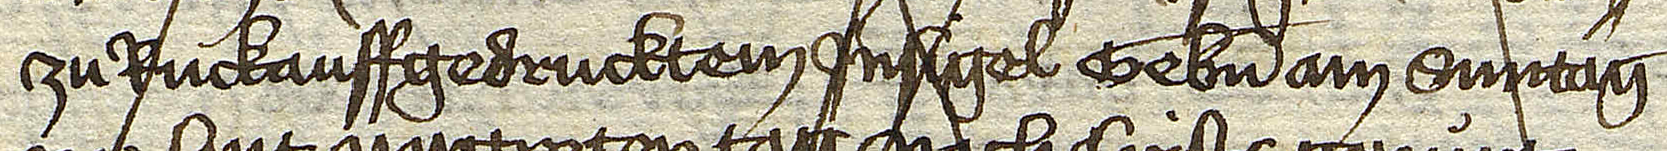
cʒu Ruckauffgedrucktem Inſigel Geb*n am Suntag
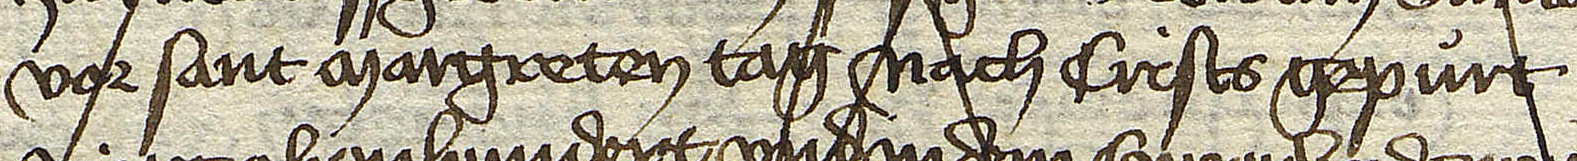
vor ſant Margreten tag Nach Criſts gepürt
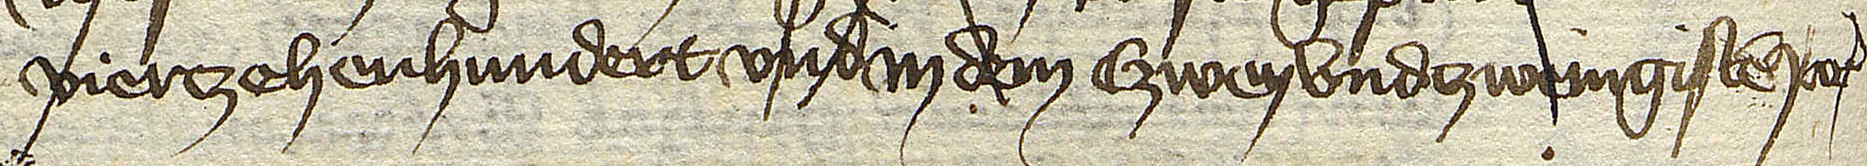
viercʒehenhundert vnd in dem Cʒweyvndcʒweingiſte* Iar
